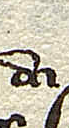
da
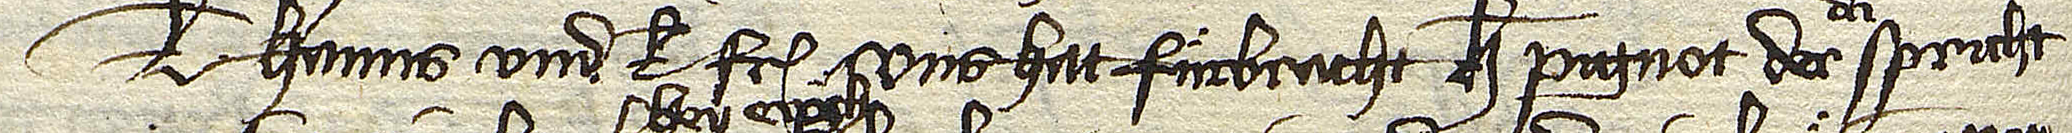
L* Hanns vnd L* fr* / Vns hat fürbracht H* Pignot der ſpricht
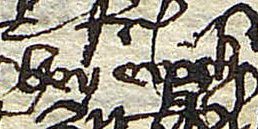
bey ewch
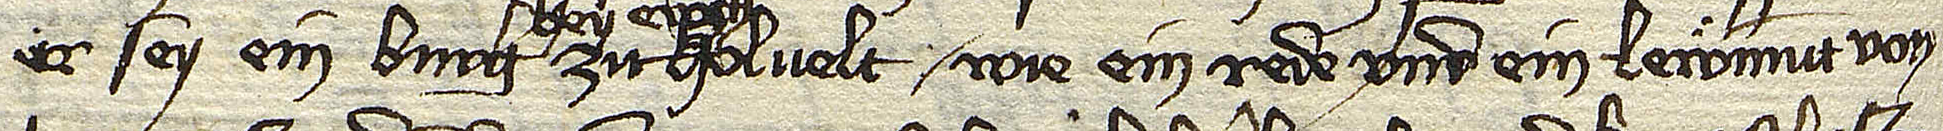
er ſey ein burg* ʒu Holuelt / wie ein rede vnd ein lewmu*t von
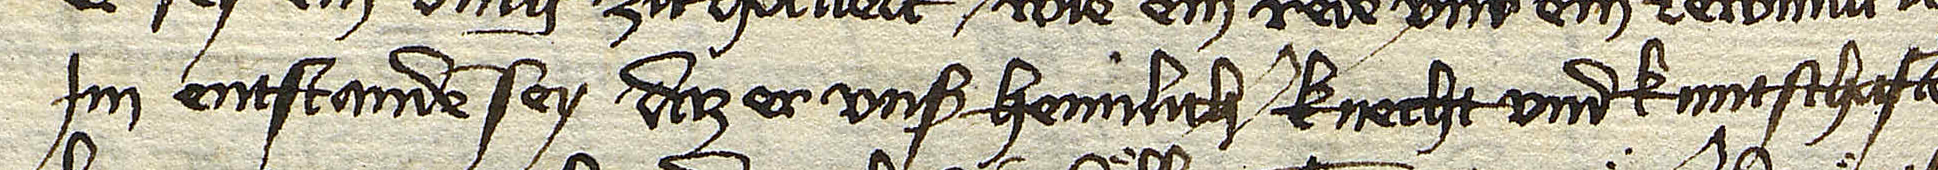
Im entſtande* ſey / daʒ er vnſ* heimlich* knecht vnd kuntſchafter
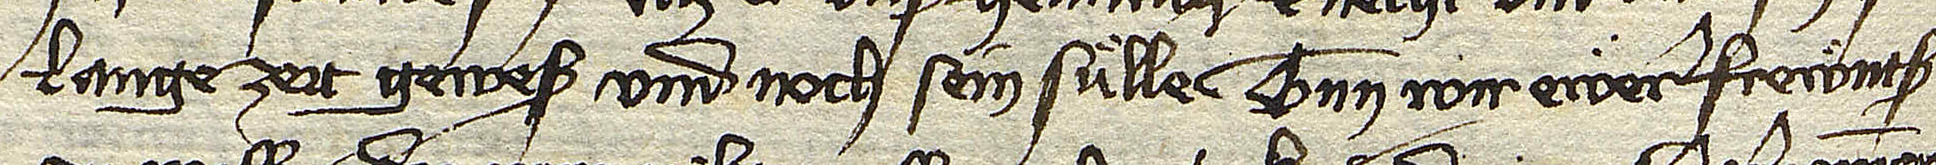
lange ʒeit geweſ* vnd noch ſein ſülle* Tun wir ewer* frewntſ*
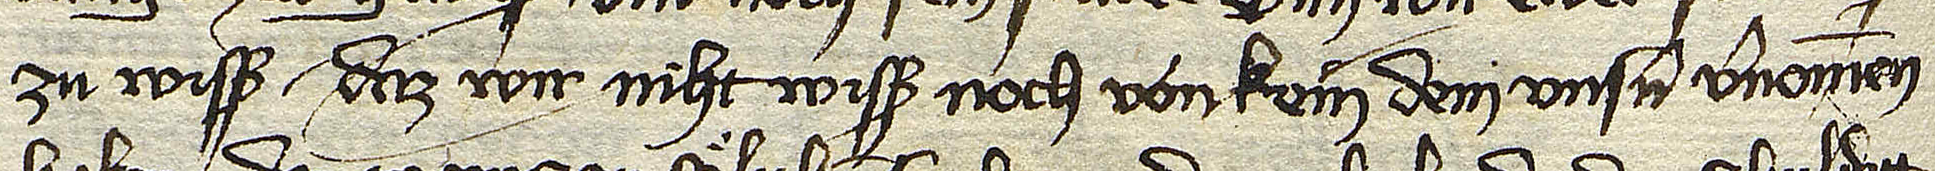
ʒu wiſſ* / daʒ wir niht wiſſ* noch von kein* dem vnſ n* v*nom*en
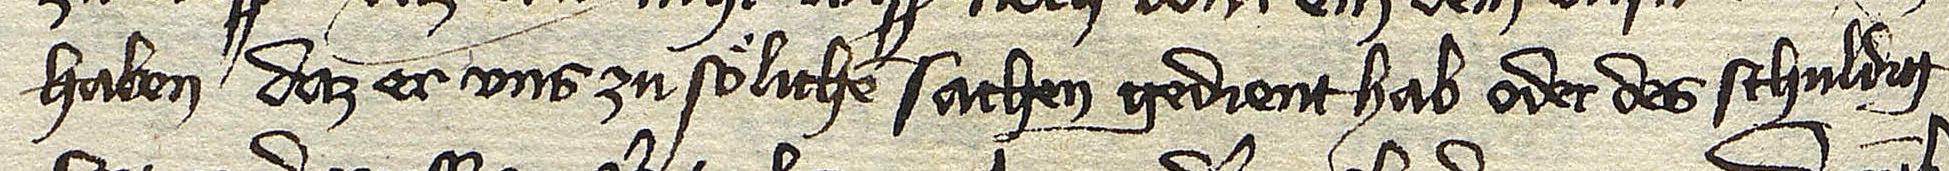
haben daʒ er vns ʒu ſöliche* ſachen gedient hab oder des ſchuldig
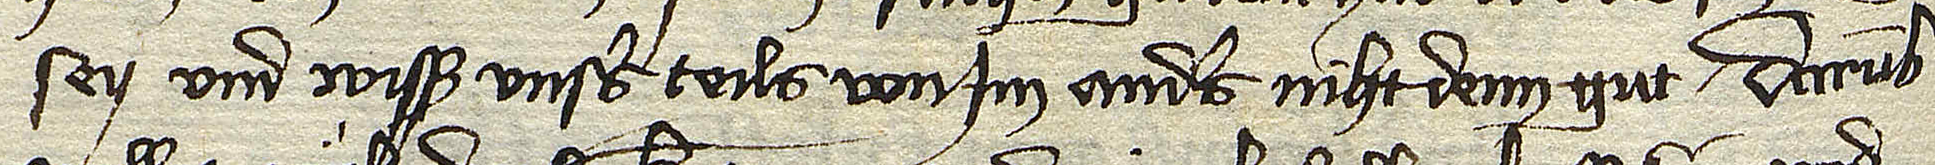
ſey vnd wiſſ* vnſ*s teils von Im and*s niht denn gut / Daru*b
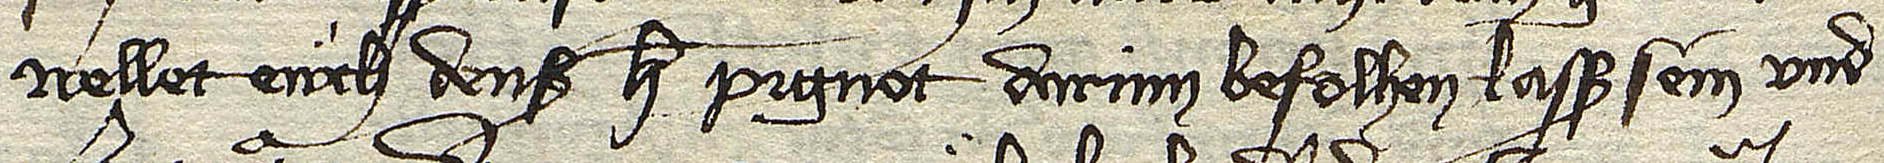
wellet ewch denſ* H* pignot darinn befolhen laſſ* ſein vnd
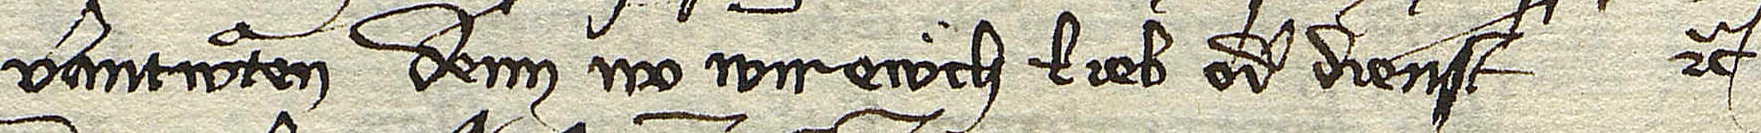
v*antw*ten Denn wo wir ewch lieb od* dienſt ec*
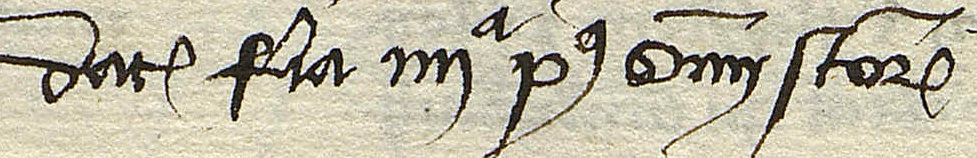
Dat* fi*a iiii* p* Omi* ſco*
